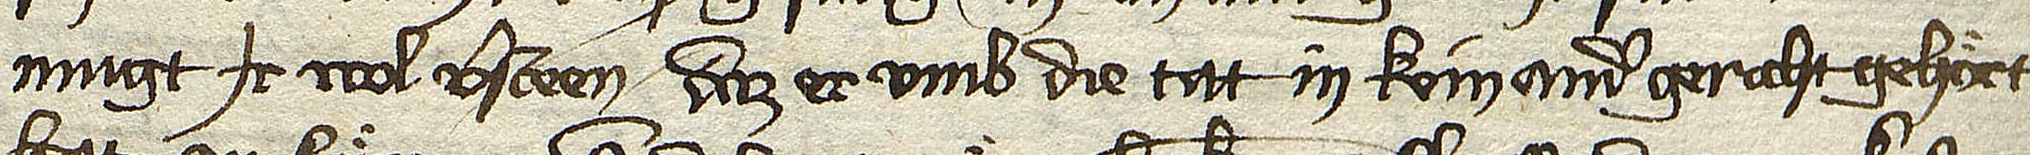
mugt Ir wol v*ſteen / daʒ er vmb die tat in kein and* gericht gehört
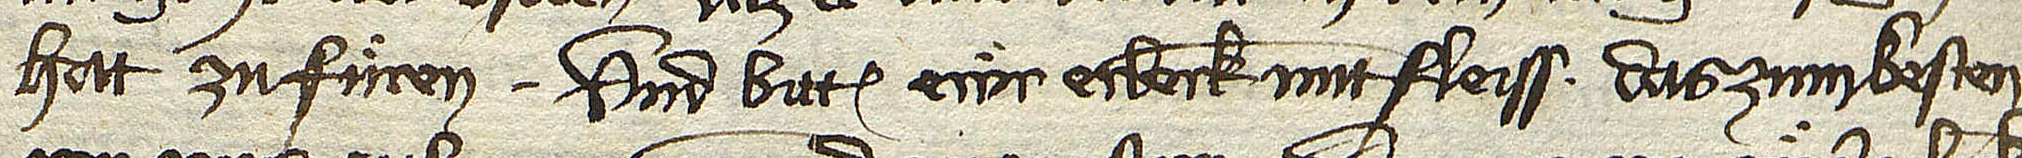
hat ʒu füren . Vnd bitt* eẅr erberk* mit fleiſſ . das ʒum beſten
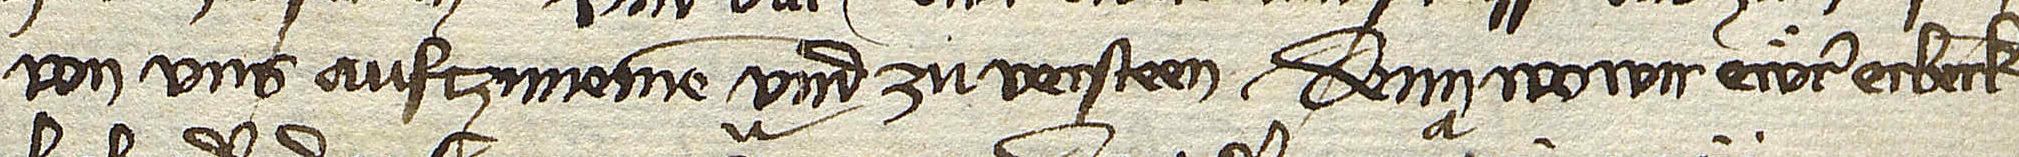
von vns aufcʒuneme* vnd ʒu verſteen / Denn wo wir eẅr* erberk*
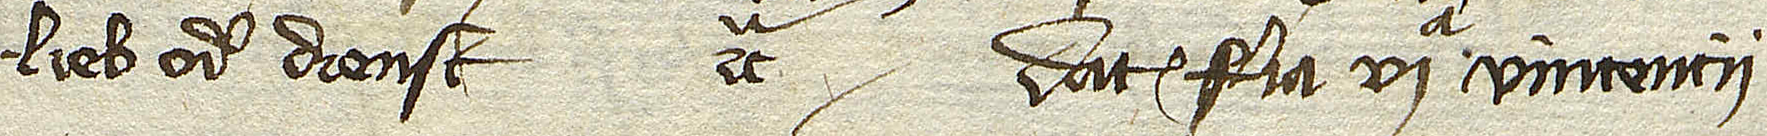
lieb od* dienſt ec* Dat* f*ia vincencii
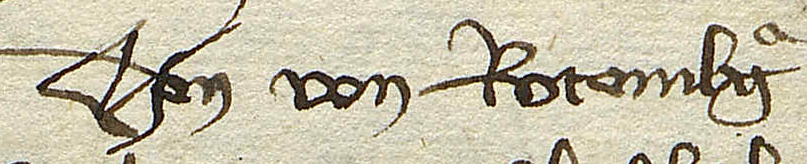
Den von Rotemb*g
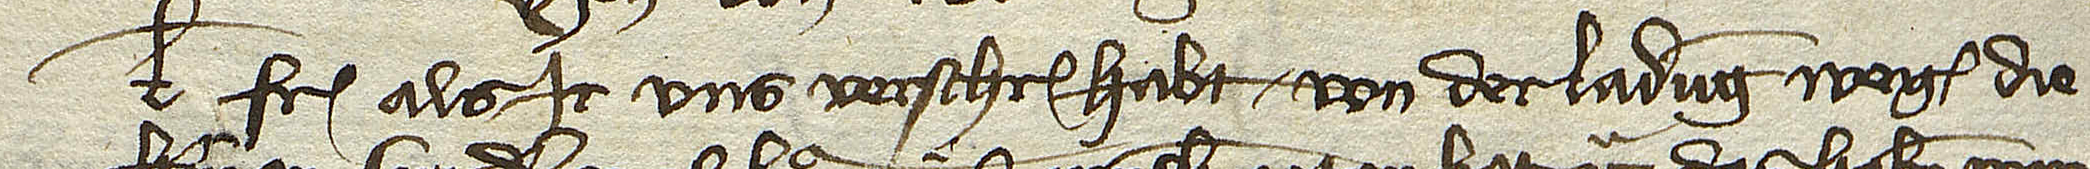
L* fr* als Ir vns verſchr* habt / von der ladu*g weg* die
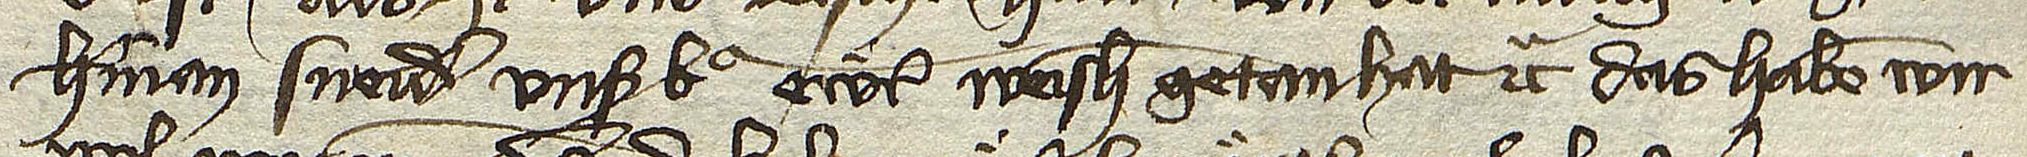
h*man ſneid* vnſ* b* eẅr* weiſh* getan hat ec* das habe* wir
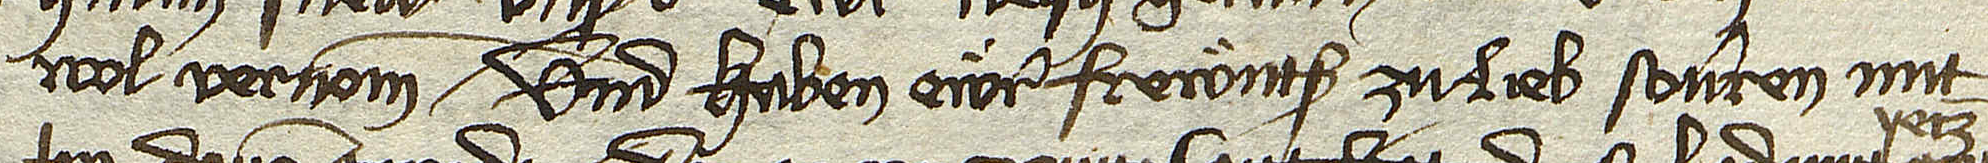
wol vernom* / Vnd haben eẅr* freẅntſ* ʒu lieb ſou*ren mit
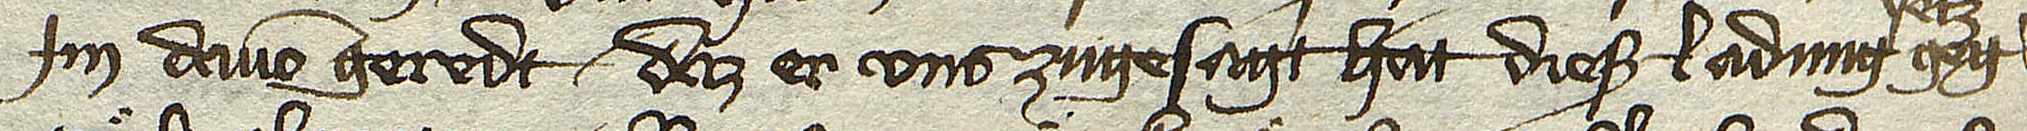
Im dauo* geredt / daʒ er vns ʒugeſagt hat dieſ* ladung geg*
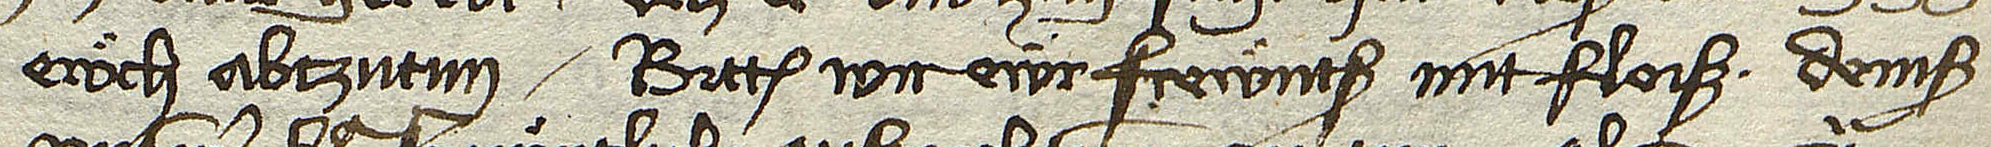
eẅch abcʒutun / Bitt* wir eẅr freẅntſ* mit fleiſʒ . demſ*
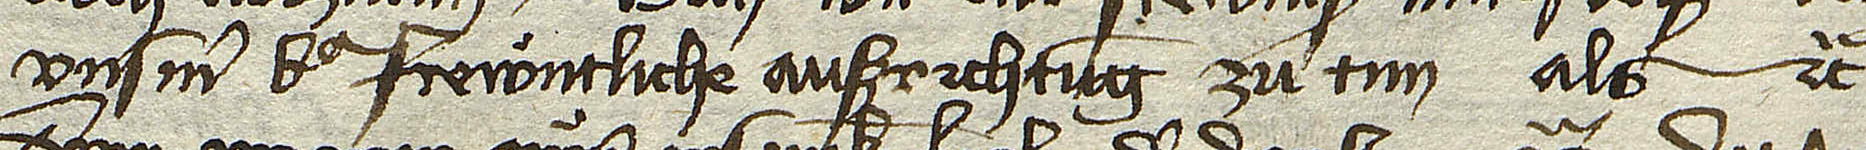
vnſ*m b* freẅntliche auſʒrichtu*g ʒu tun als ec*
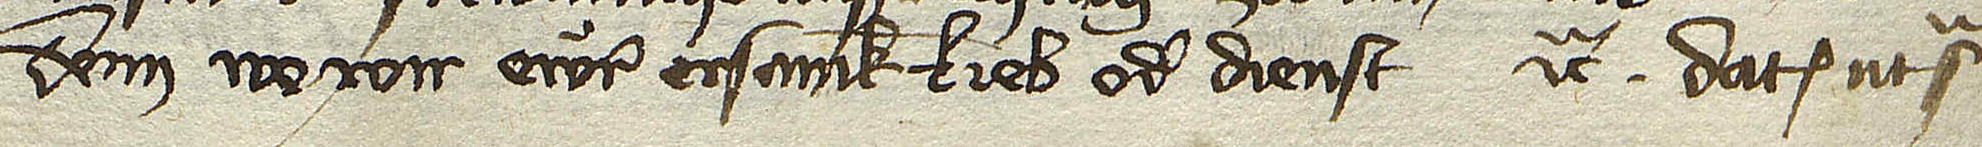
Denn wo wir eẅr* erſamk* lieb od* dienſt ec* . Dat* ut ſ*
